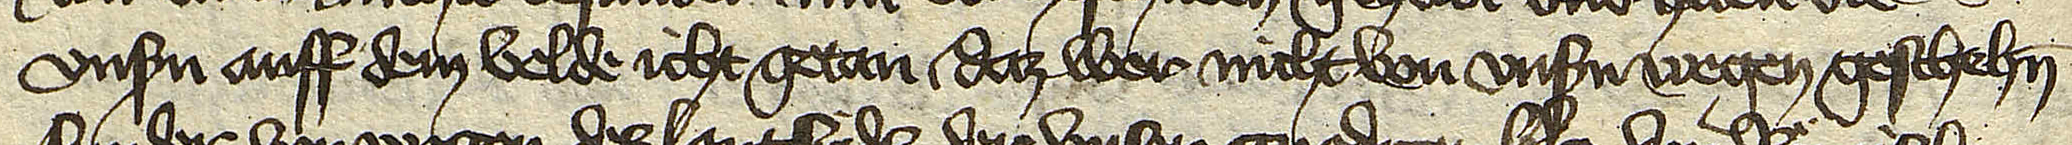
vnſ*n auff dem velde icht getan / daʒ wer nicht von vnſ*n wegen geſchehn*
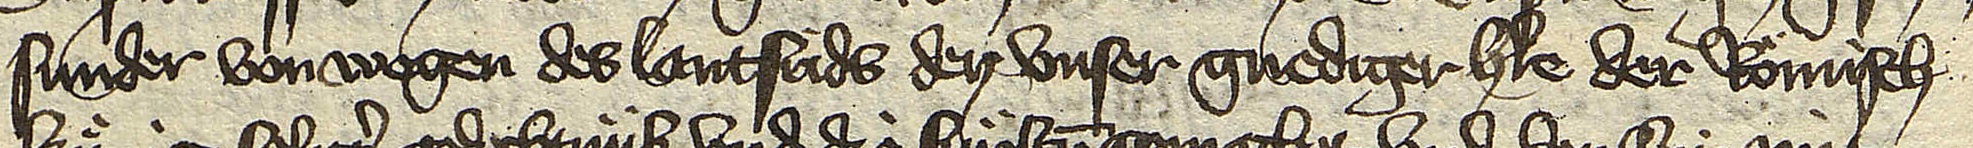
ſunder von wegen des lantfrids den vnſer gnediger h*re der Römiſch
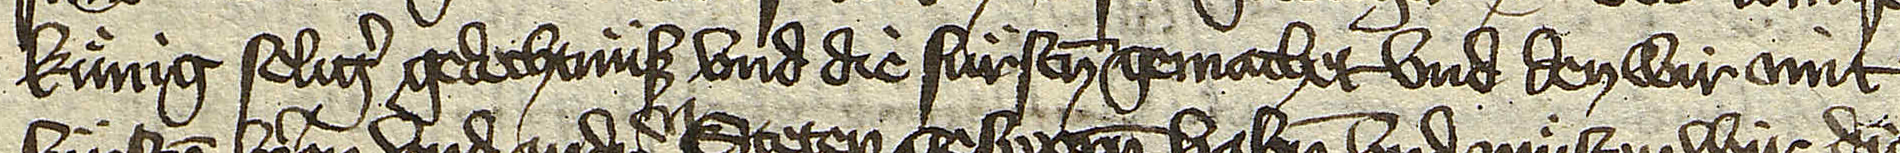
Künig ſelig* gedechtnüſʒ vnd die fürſtn* gemachet vnd den wir mit
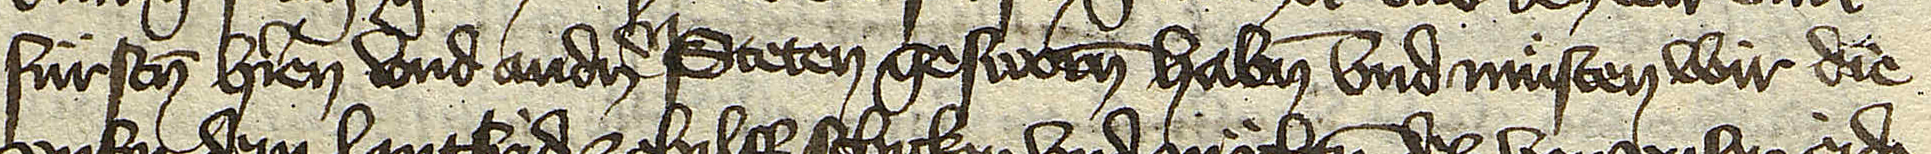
fürſtn* hr*en vnd andn* Steten geſworn* habn* vnd müſten wir die
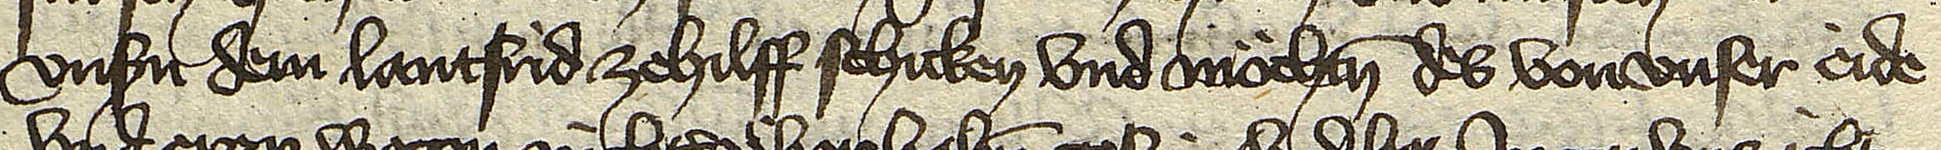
vnſ*n dem lantfrid cʒehilff ſchicken vnd möchtn* des von vnſer eide
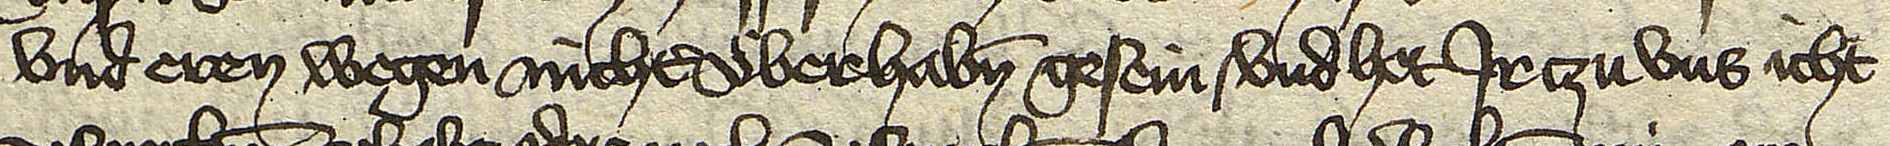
vnd eren wegen nicht v̈berhabn* geſein / vnd het Ir cʒu vns icht
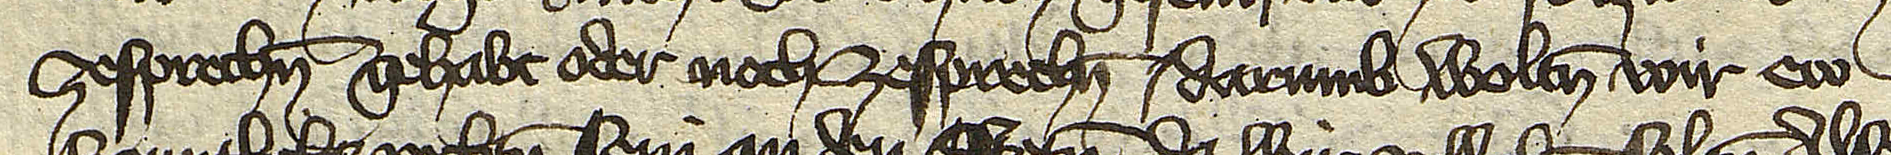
cʒeſprechn* gehabt oder noch cʒeſprechn* / darumb woltn* wir ew
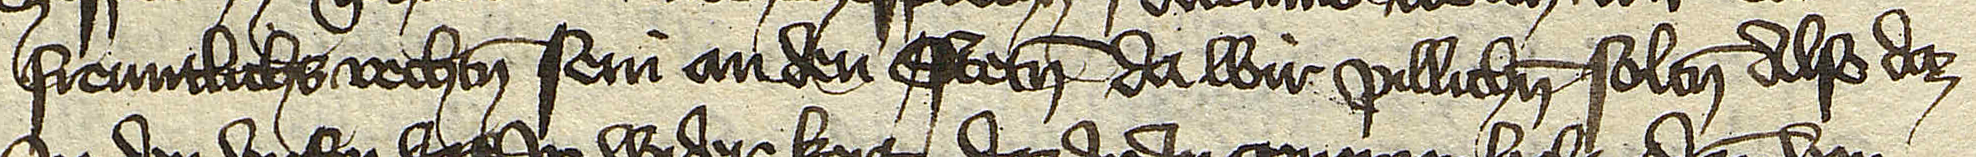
freuntlichs* rechtn* ſein an den Stetn* da wir pillichn* ſoltn* Alſo daʒ
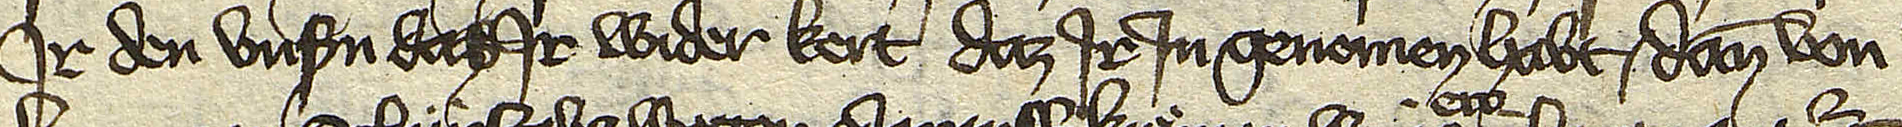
Ir den vnſ*n das Ir wider kert daʒ Ir In genomen habt / dan* von
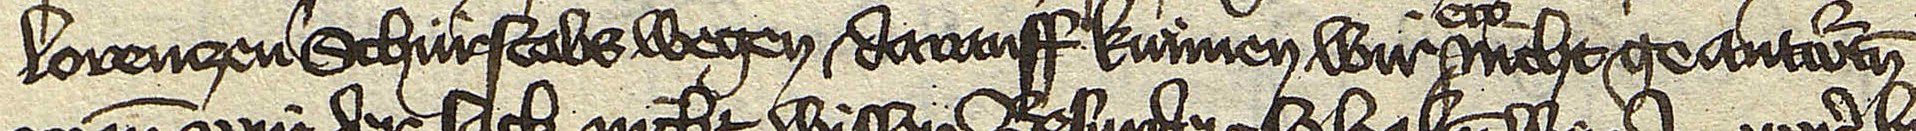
lorencʒen Schürſtabs wegen / darauff künnen wir nicht geantw*tn*
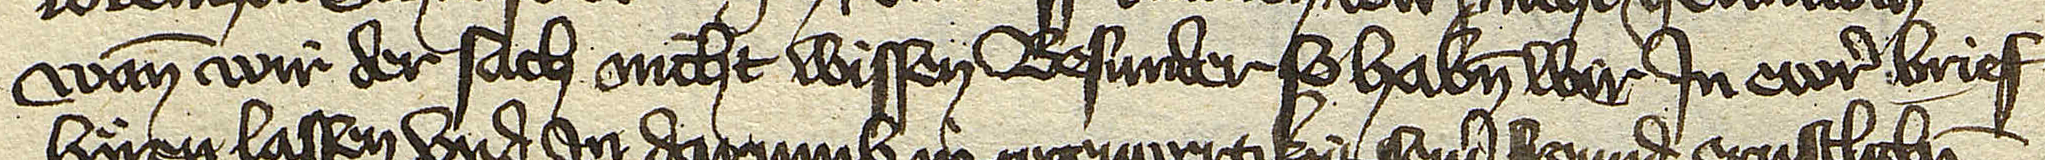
wan* wir der ſach nicht wiſſen Beſunder ſo habn* wir In ewr* brief
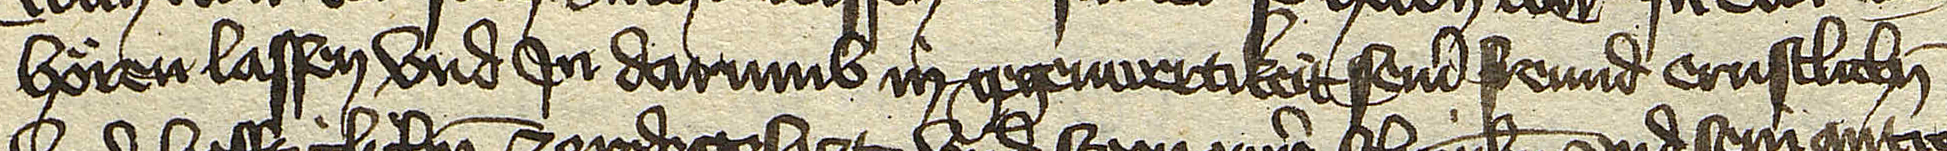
hören laſſen vnd In darumb in gegenwertikeit ſein* freund ernſtlichn*
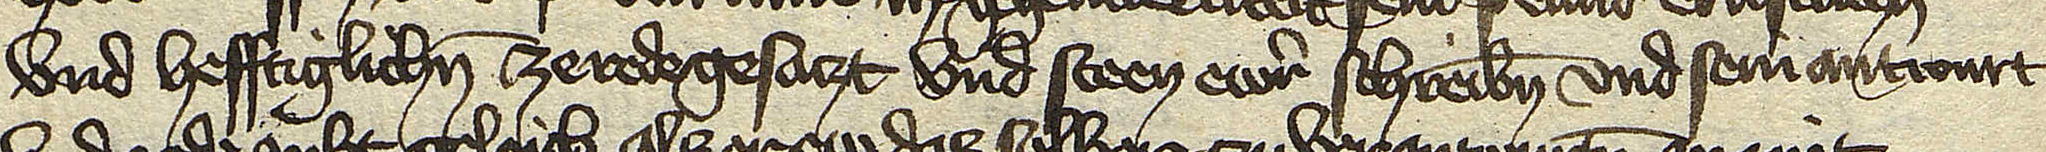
vnd hefftiglichn* cʒerede geſacʒt vnd ſteen ewr* ſchreibn* vnd ſein antwurt
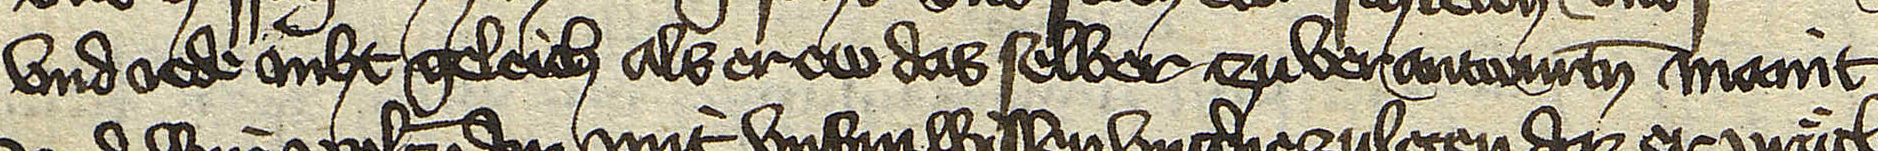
vnd rede niht geleich als er ew das ſelber cʒuverantwurtn* maint
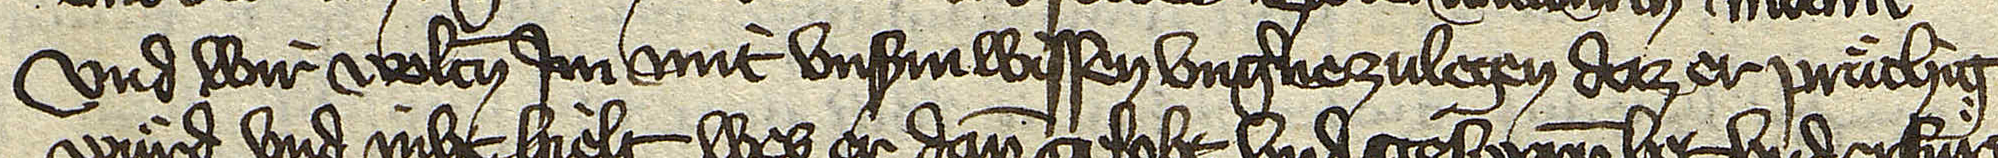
vnd wir woltn* Im mit vnſ*m wiſſen vng*ne cʒulegen daʒ er prüchig
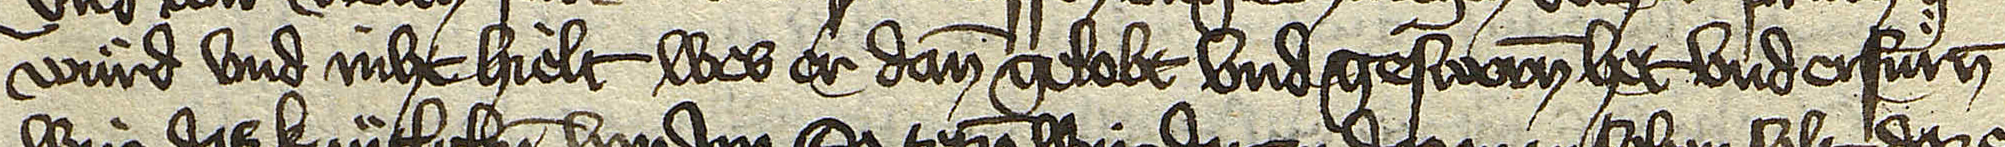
würd vnd niht hielt wes er dan* gelobt vnd geſworn* het vnd erfürn*
